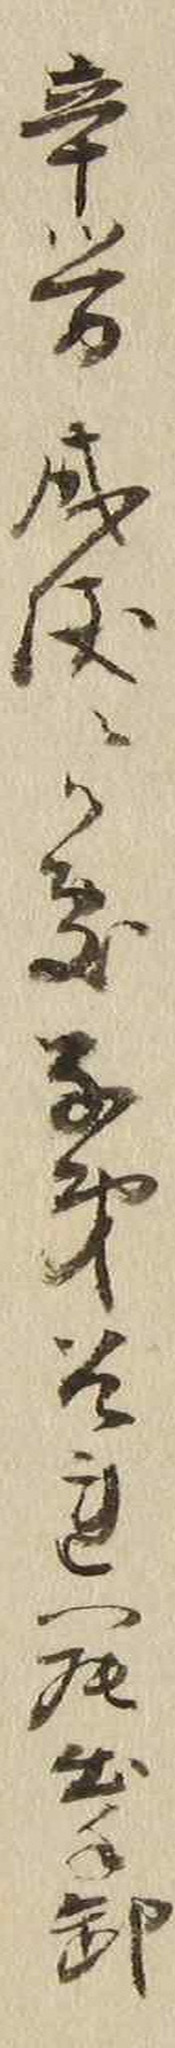辛労成儀ニ候処子弟召連罷出手卸
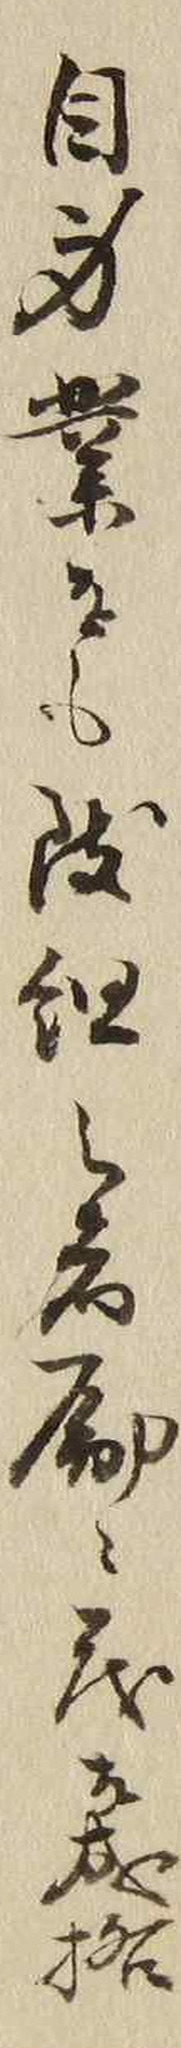自身業にも致組之者励々茂相成格
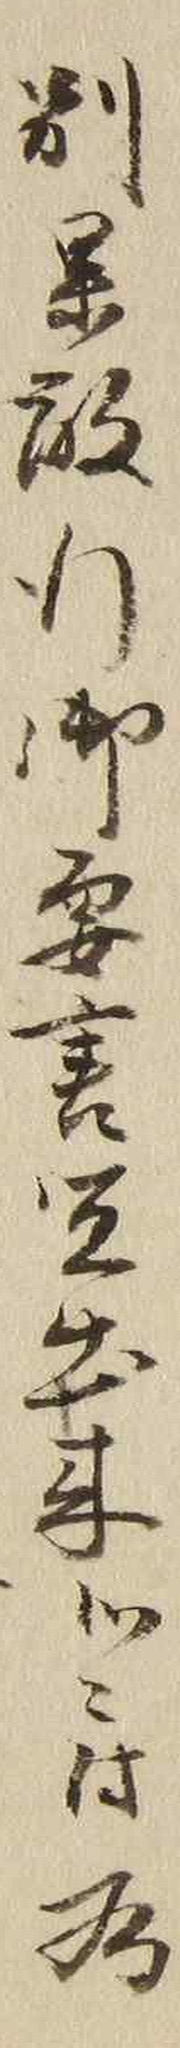別果敢行御要害宜出来候ニ付為
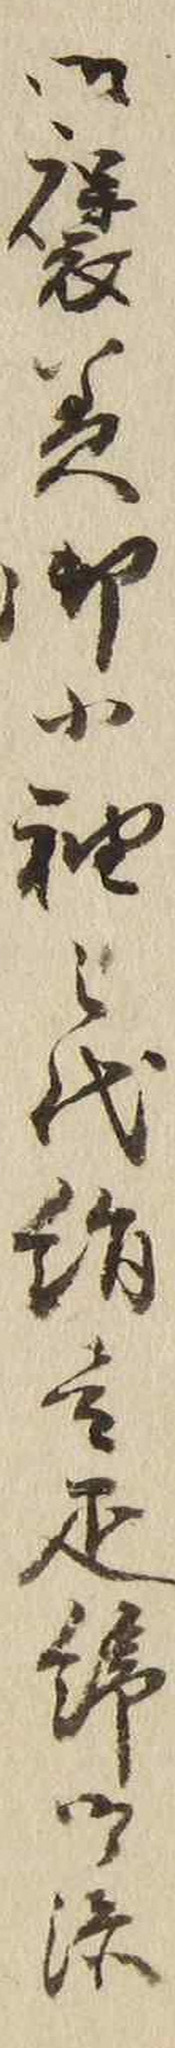御褒美御小袖之代絹壱疋綿御添
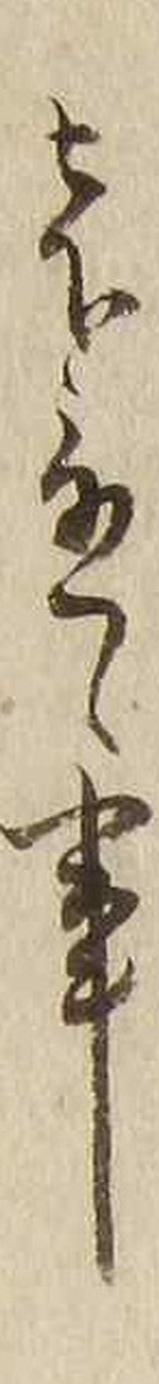被下置候事

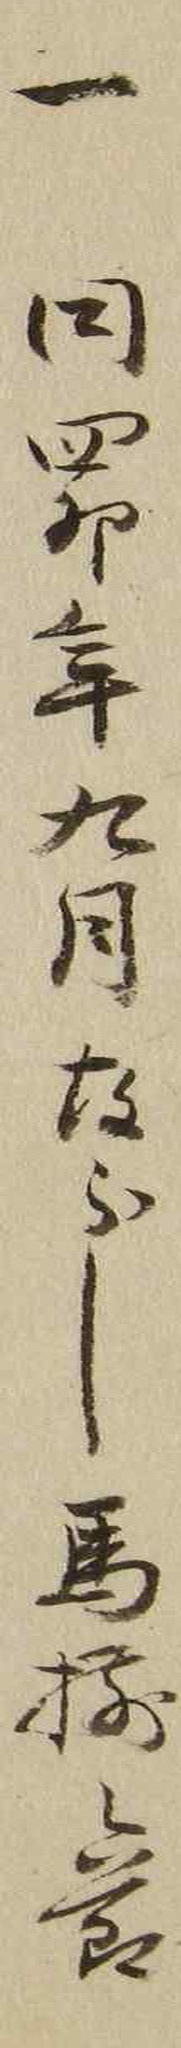一同四卯年九月ならし馬揃之節
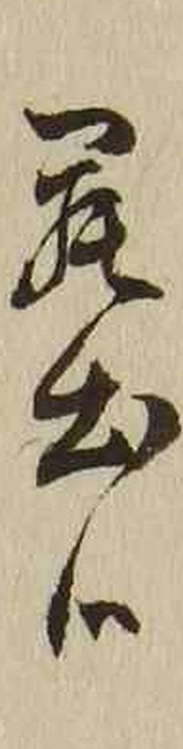罷出候
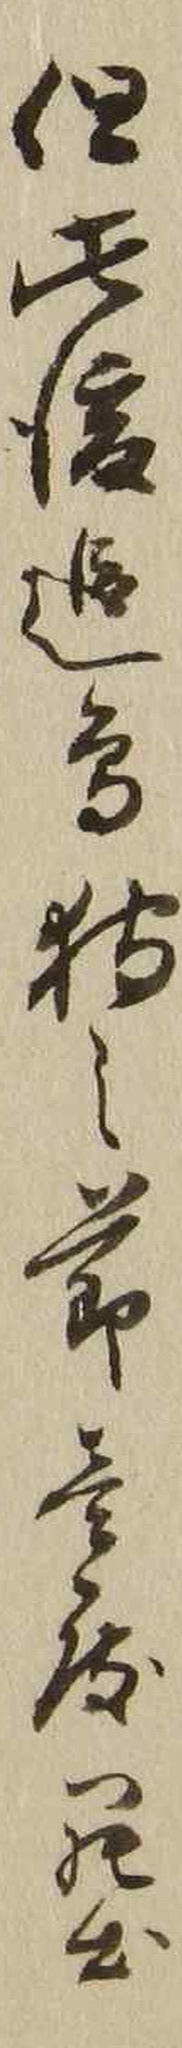但此後追鳥狩之節壱度罷出
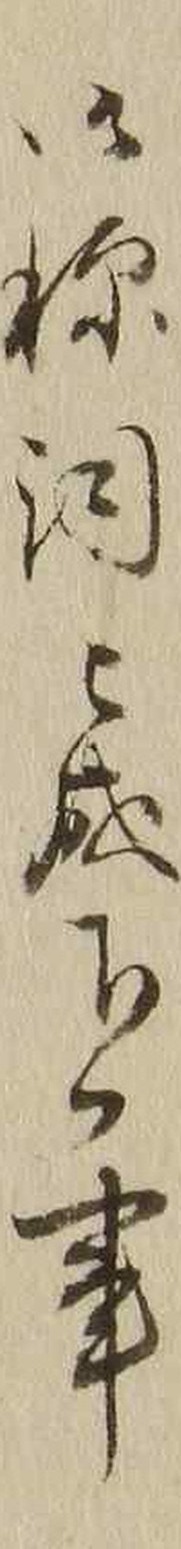御称詞被成下候事
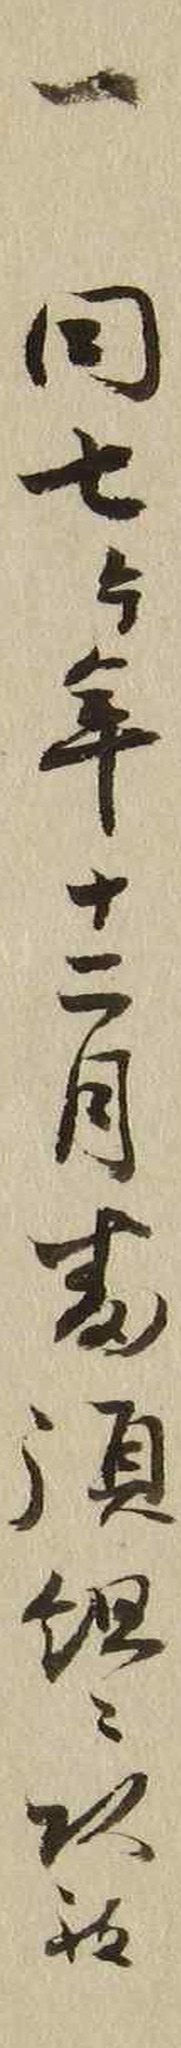一同七午年十二月番頭組々頭被
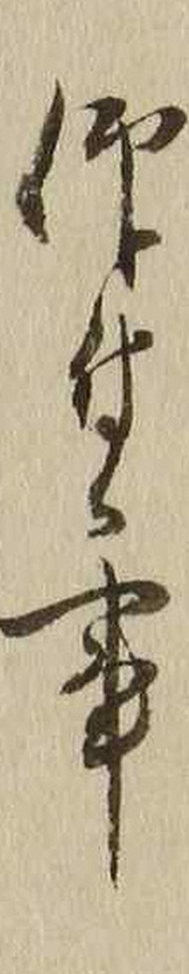仰付候事
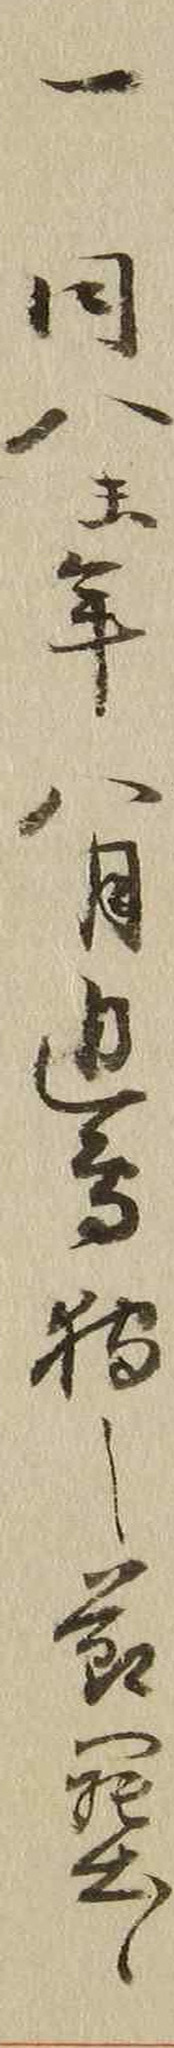一同八未年八月追鳥狩之節罷出候
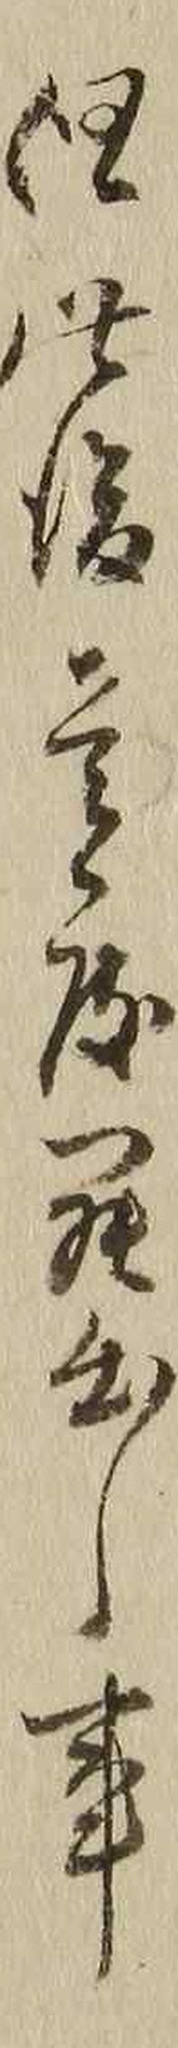但此後壱度罷出候事
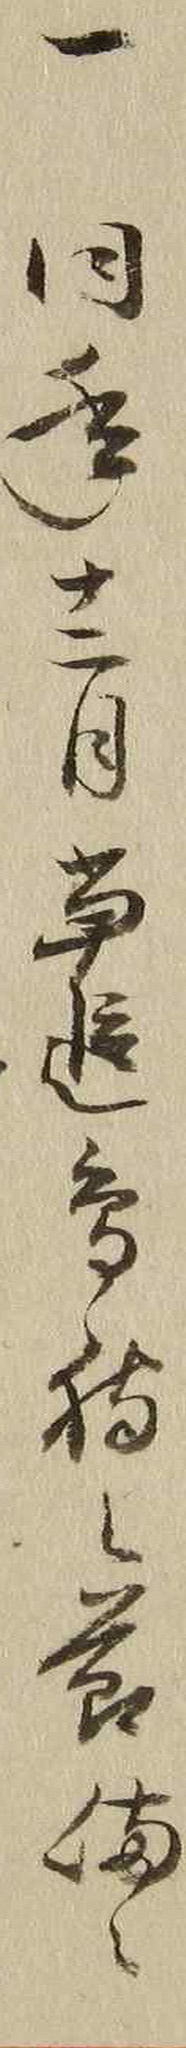一同年十二月当追鳥狩之節備之
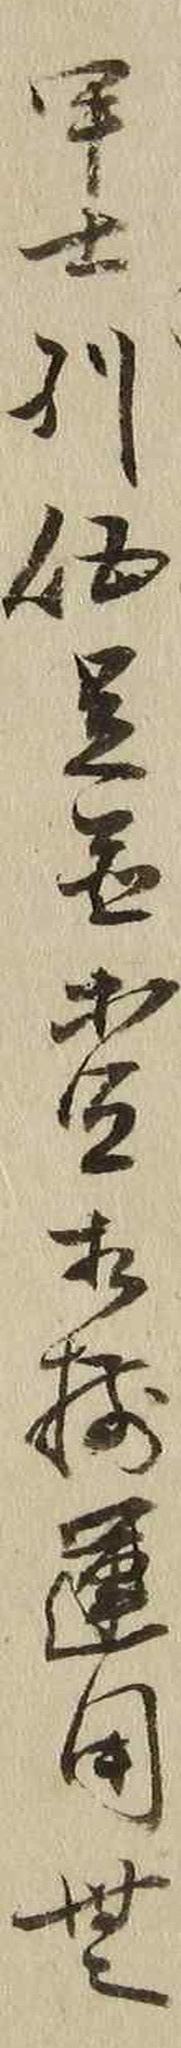甲士列伍足並等宜相揃運用無
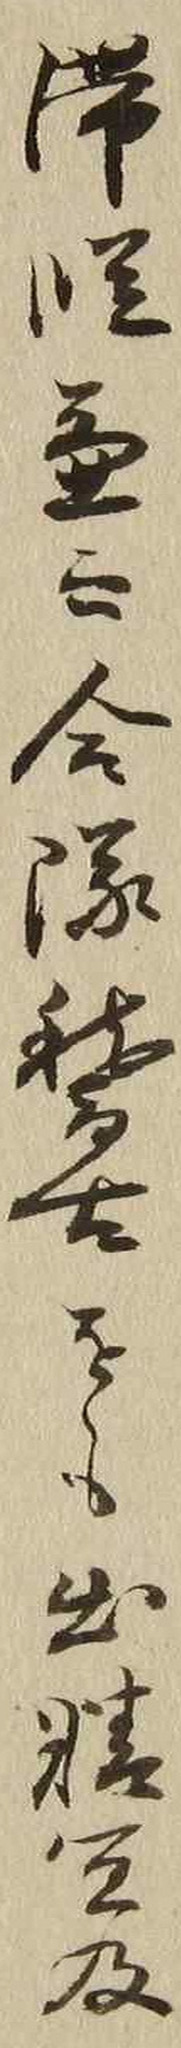滞段兼而合隊稽古をも出精宜及
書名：諸士系譜　巻之225　ま之部6
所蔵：会津若松市立会津図書館
